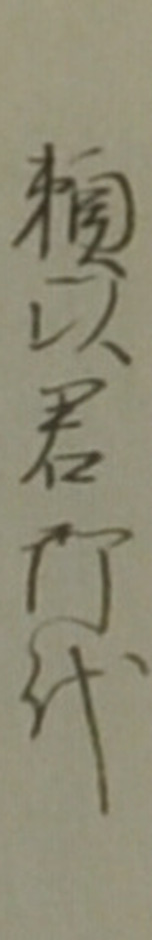頼以君御代
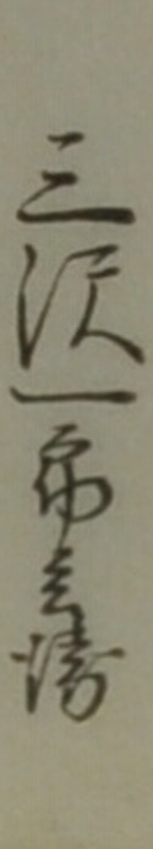三沢一郎兵衛
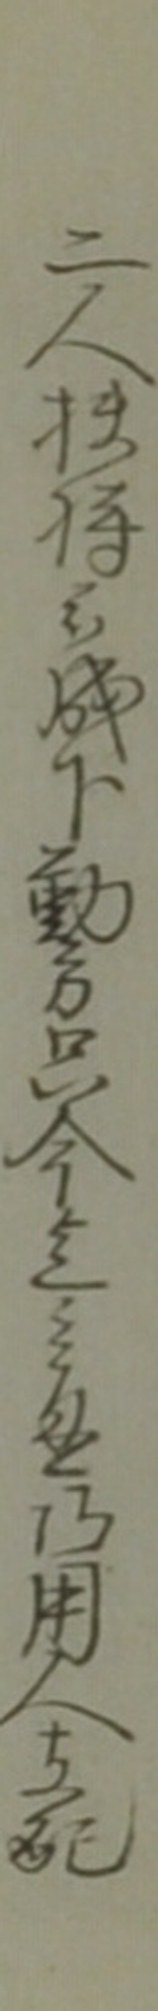二人持被成下勤方只今迠之御用人支配
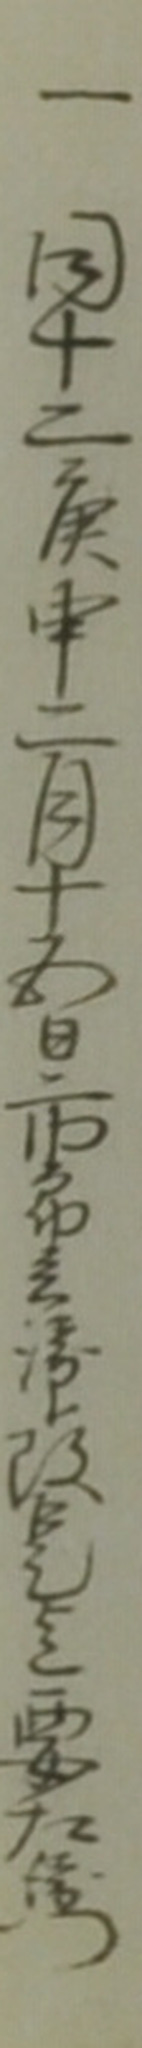一同十二庚申二月十五日市郎兵衛ト改是迠要左衛門
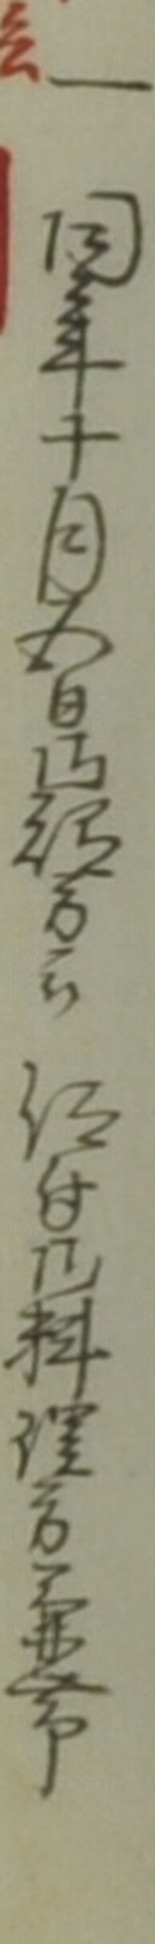一同年十月五日御役方被仰付御料理方兼帯
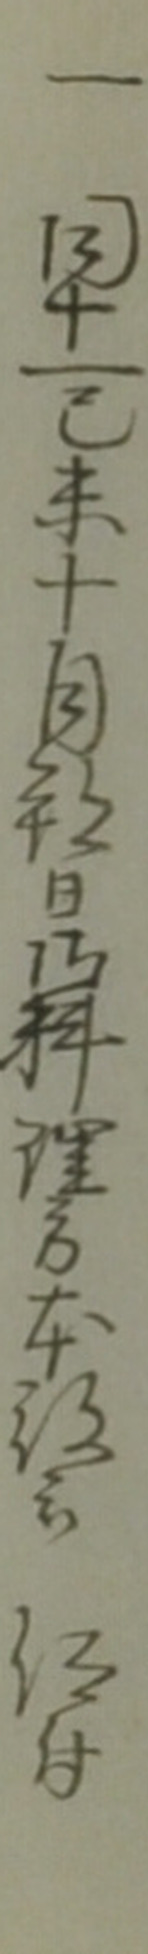一同十一巳未十月朔日御料理方本役被仰付
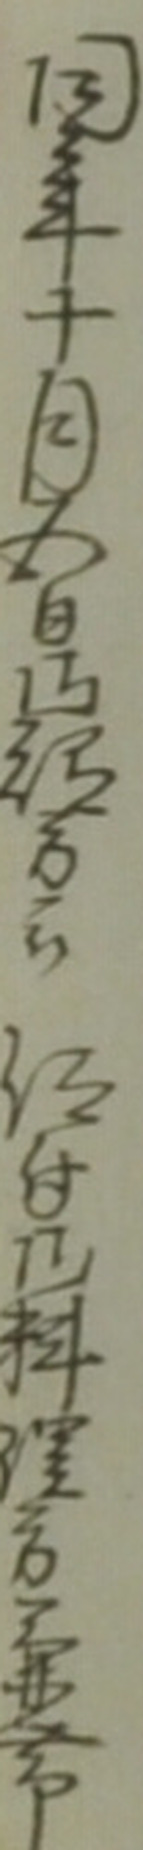一同年十月五日御役方被仰付御料理方兼帯

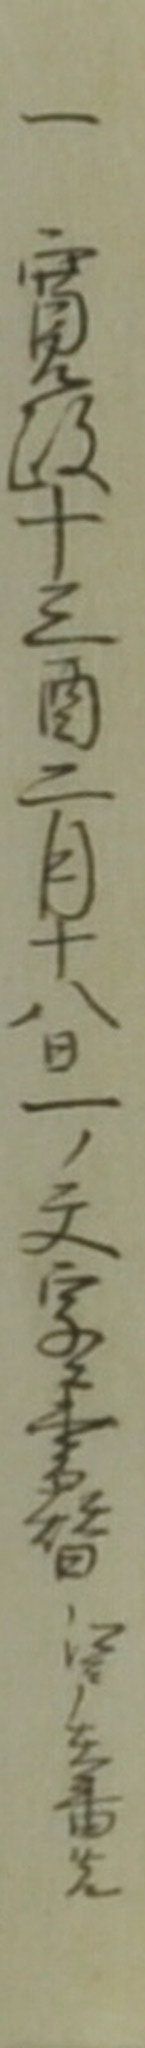一寛政十三酉二月十八日一ノ文字ニ書替江戸在番先
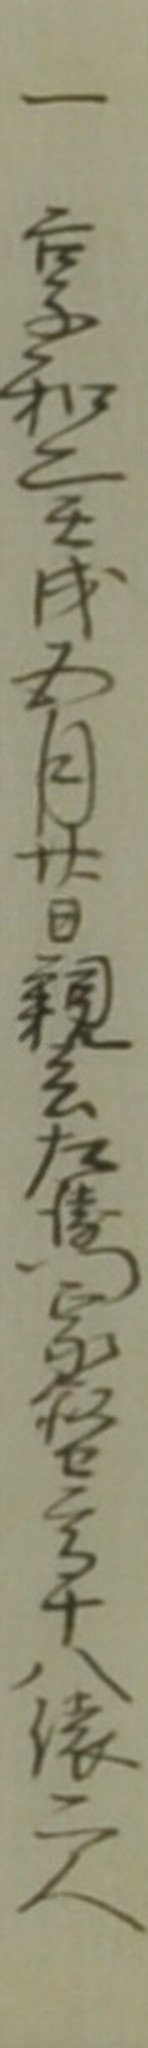一享和二壬戌五月廿日親兵左衛門家督高十八俵二人
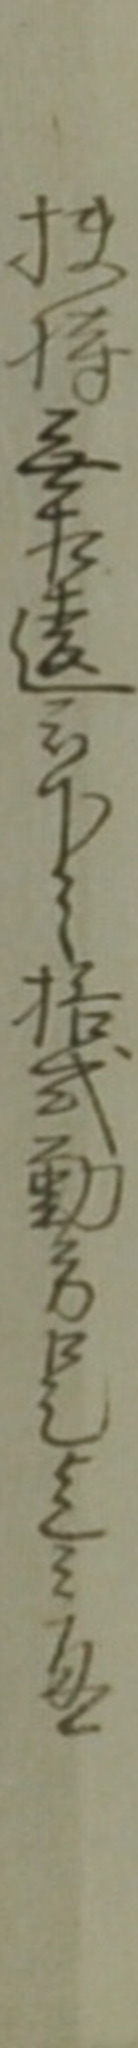扶持無相違被下之格式勤方是迄之通
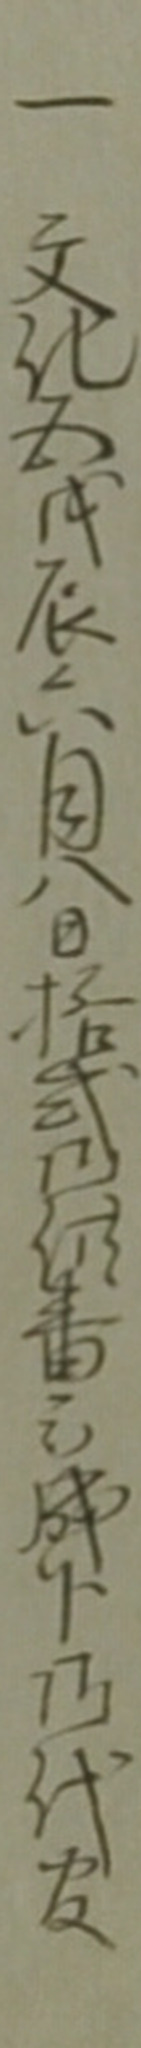一文化五戌辰六月八日格式御供番被成下御代官
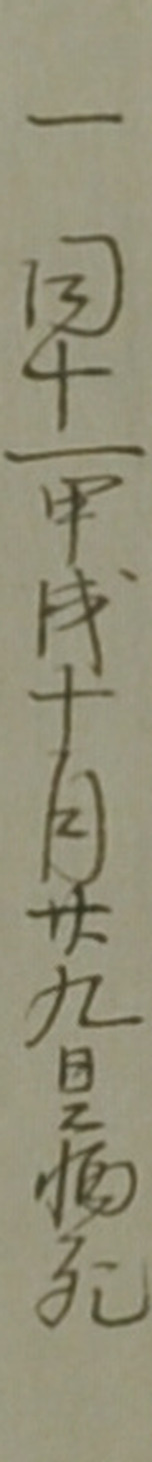一同十一甲戌十月廿九日病死
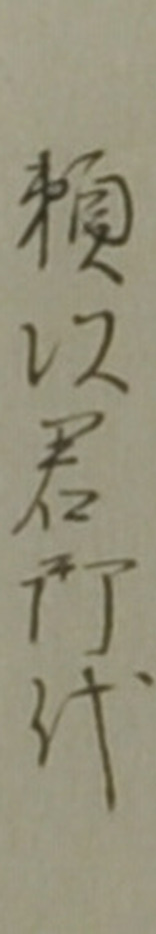頼以君御代
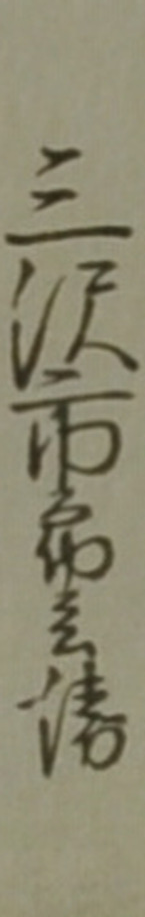三沢市郎兵衛
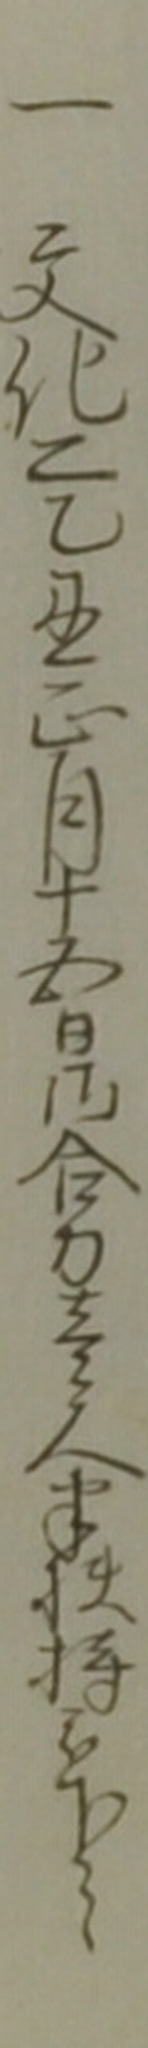一文化二乙丑正月十五日御合力壱人半扶持被下之
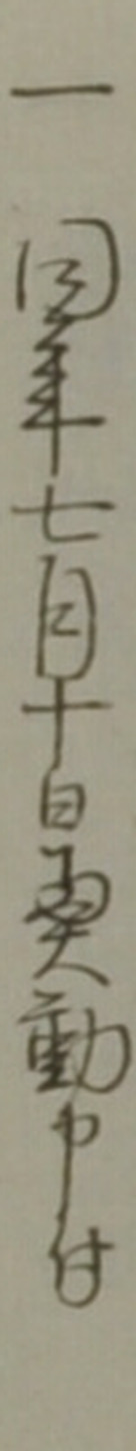一同年七月十日奥勤申付
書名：無足諸士勤仕録（八）
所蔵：伊那市立高遠町図書館・合同会社AMANE
